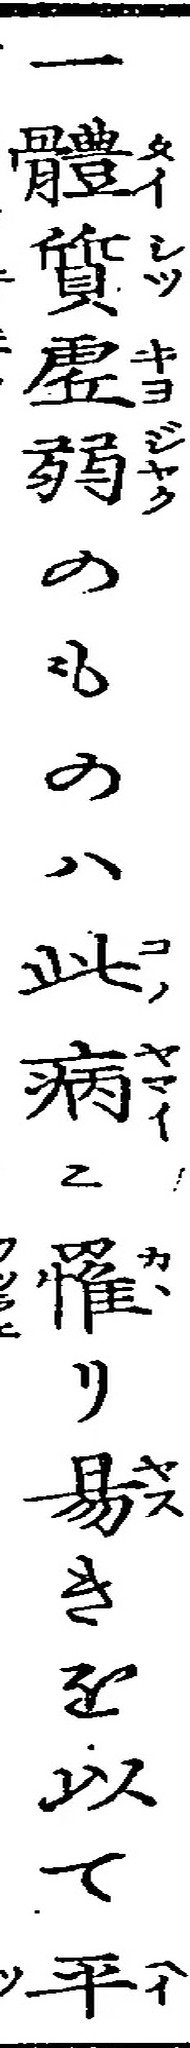一體質虚弱のものは此病に罹り易きを以て平
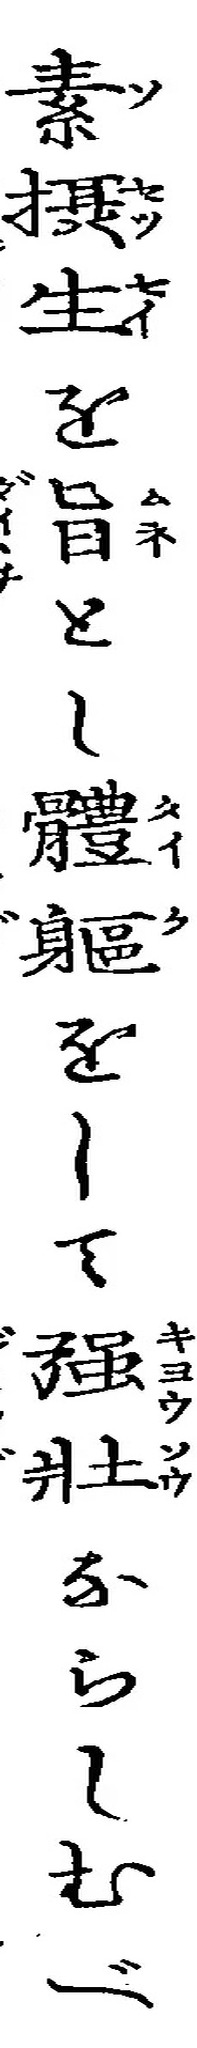素摂生を旨とし体躯をして強壮ならしむべ
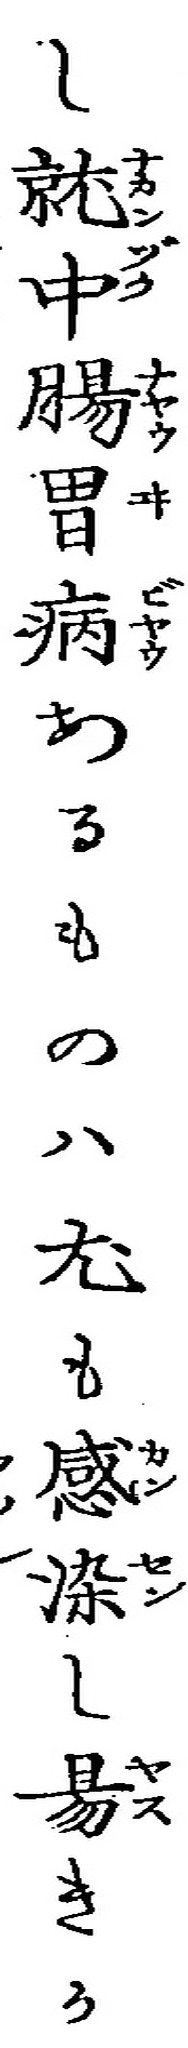し就中腸胃病あるものは尤も感染し易きか
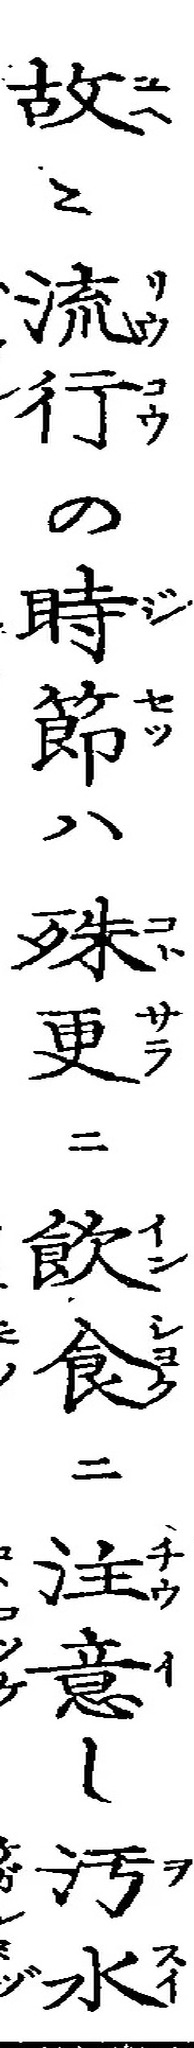故に流行の時節は殊更に飲食に注意し汚水
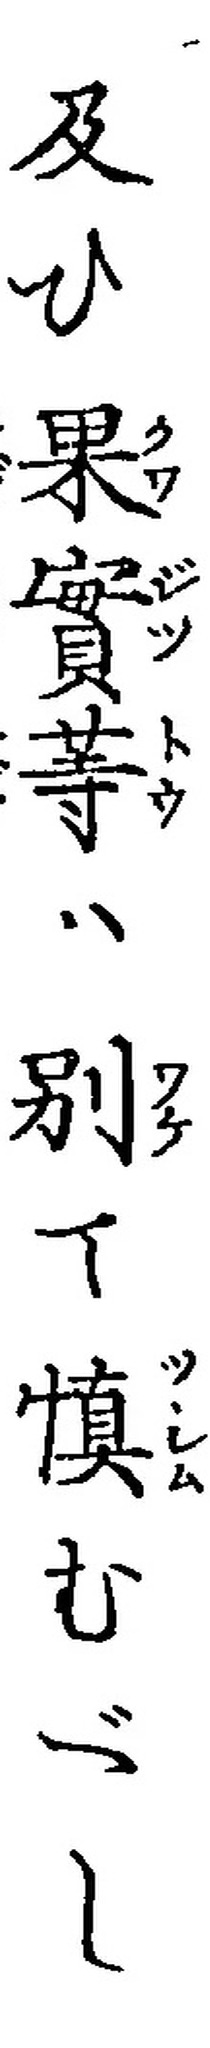及ひ果実等は別て慎むべし
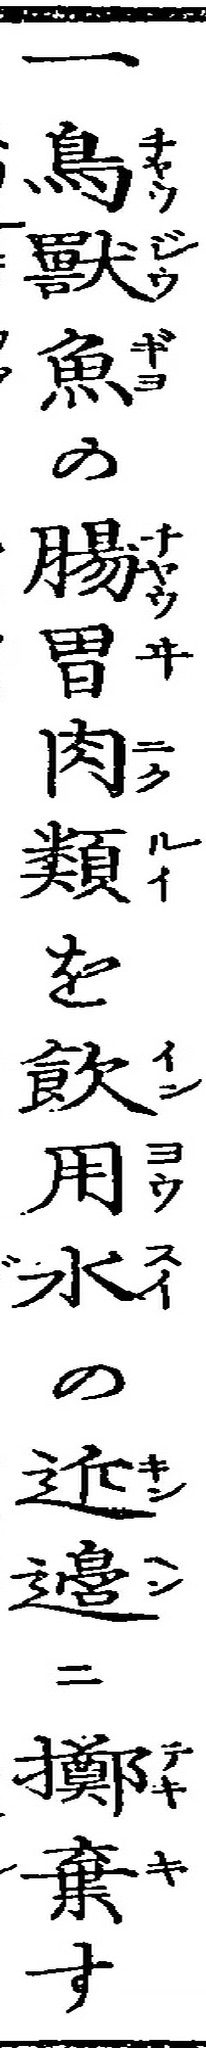一鳥獣魚の腸胃肉類を飲用水の近辺に擲棄す

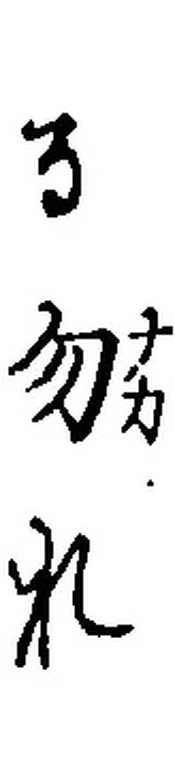る勿れ
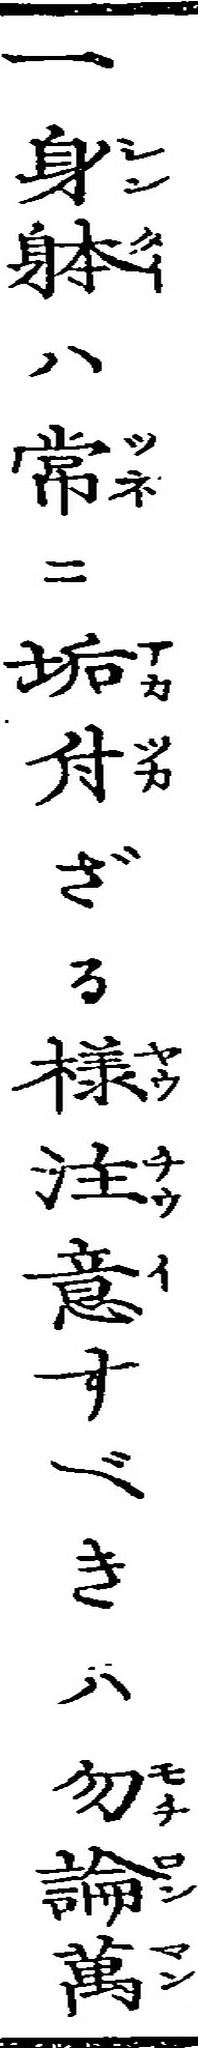一身体は常に垢付ざる様注意すべきは勿論万
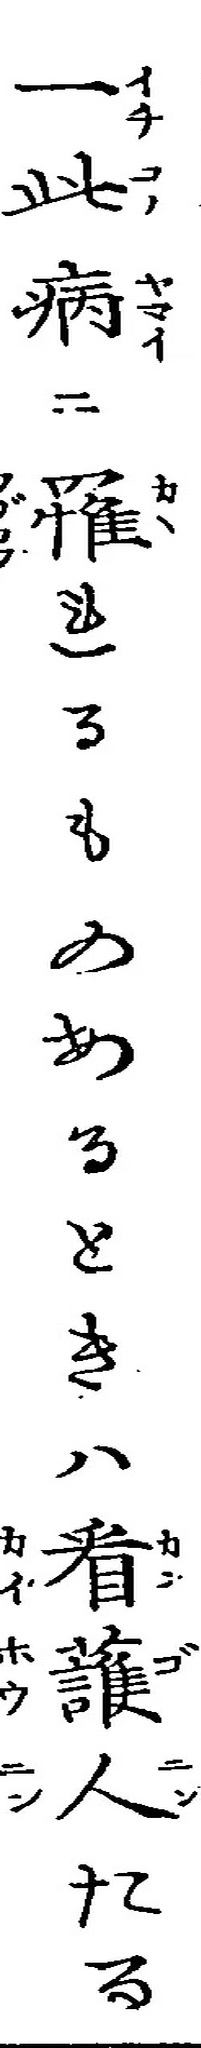一此病に罹れるものあるときは看護人たる
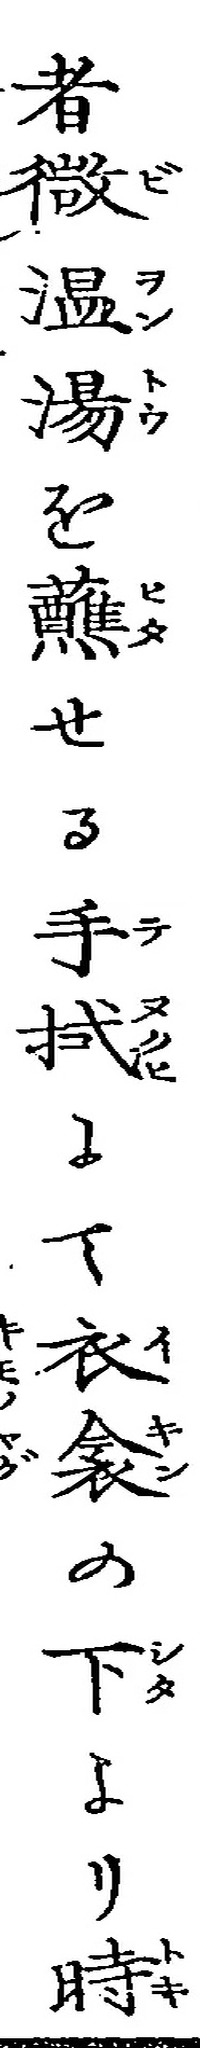者微温湯を蘸せる手拭にて衣衾の下より時
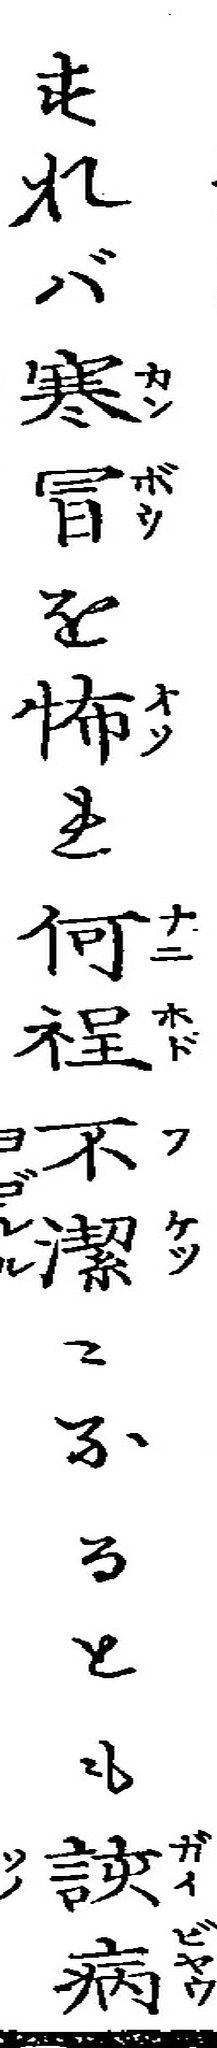すれば寒冒を怖れ何程不潔になるとも該病
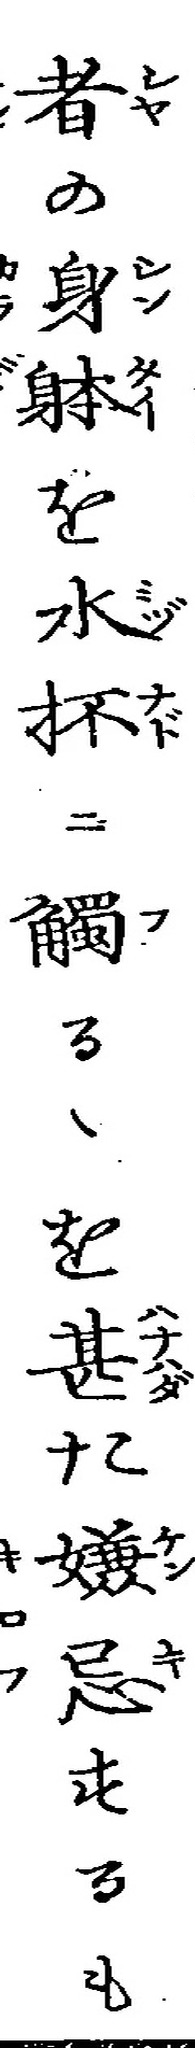者の身体を水杯に触るゝを甚た嫌忌するも
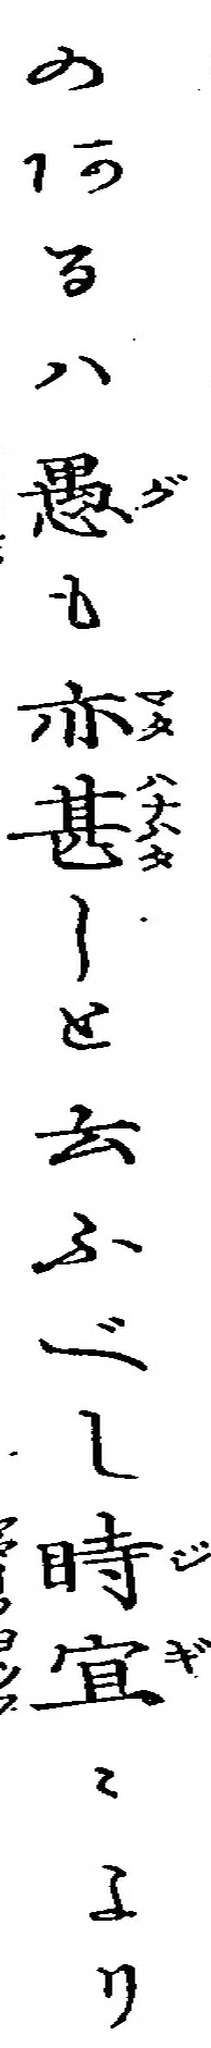のあるは愚も亦甚しと云ふべし時宜により
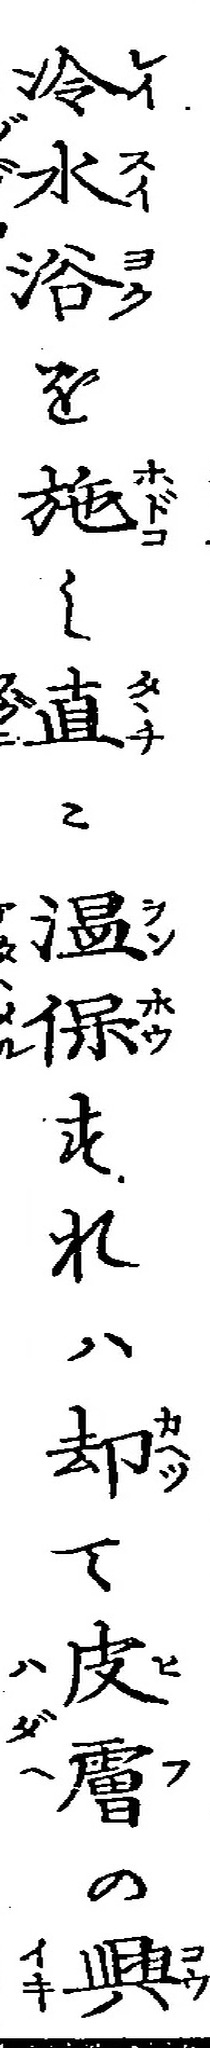冷水浴を施し直に温保すれば却て皮膚の興
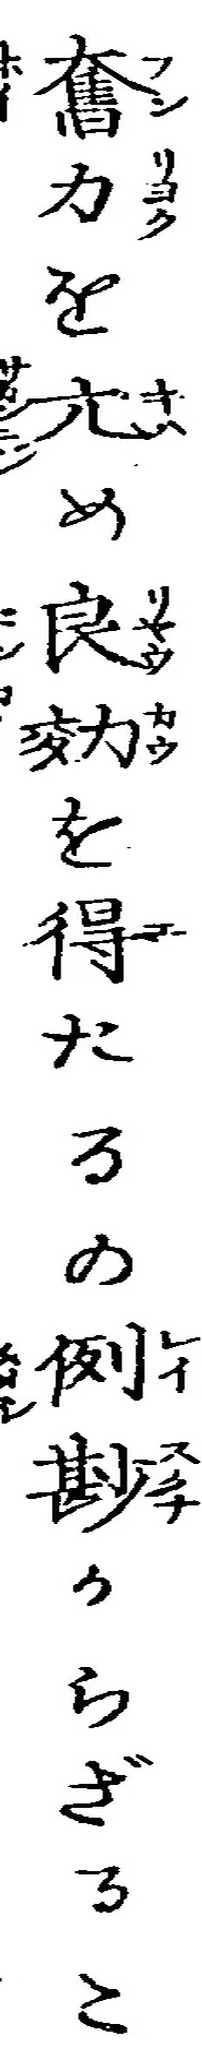奮力を亢め良効を得たるの例尠からざるこ
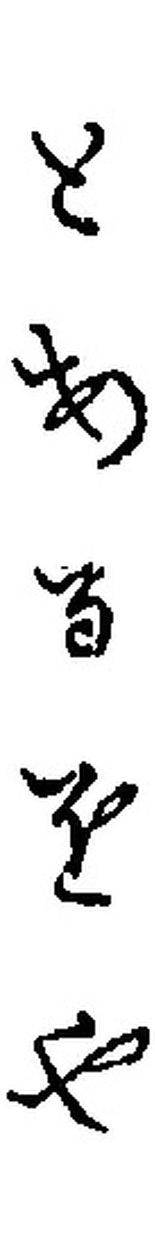とあるをや
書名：伝染病予防法
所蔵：国立国会図書館 National Diet Library, JAPAN
